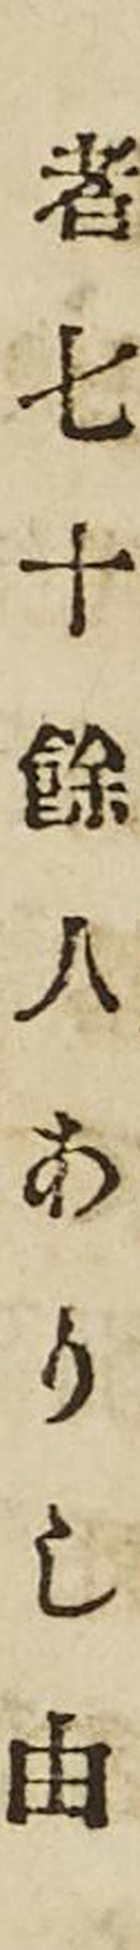者七十余人ありし由
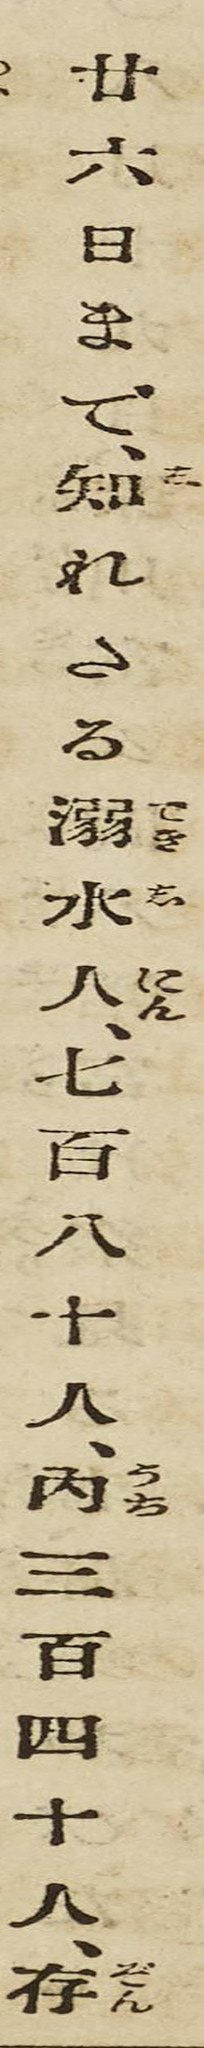廿六日まで、知れたる溺水人、七百八十人、内三百四十人、存
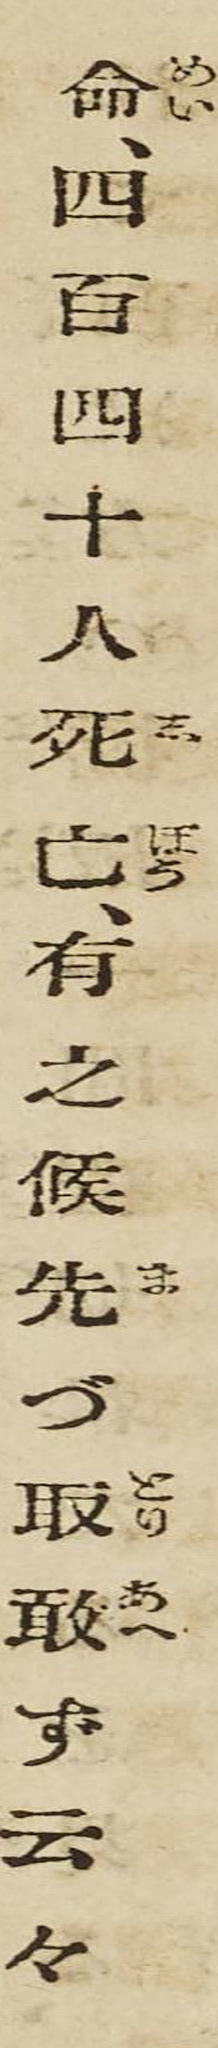命、四百四十人死亡、有之候先づ取敢ず云々
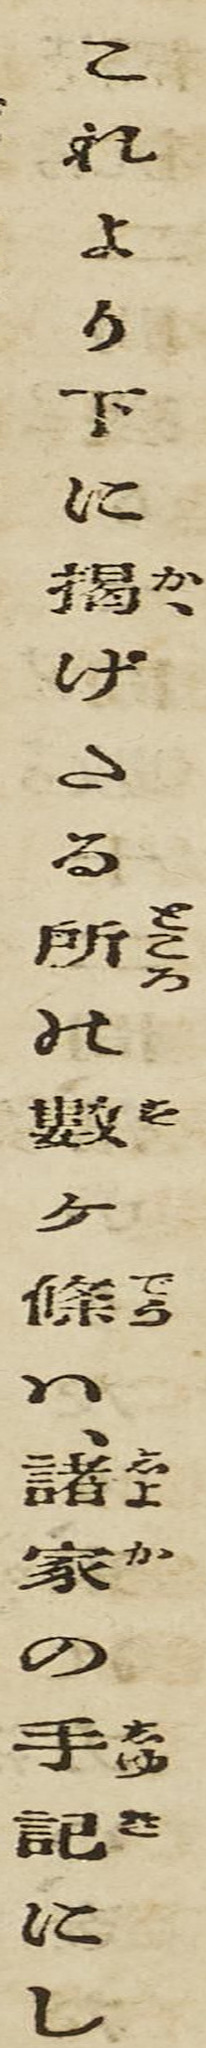これより下に掲げたる所の数ケ條は、諸家の手記にし
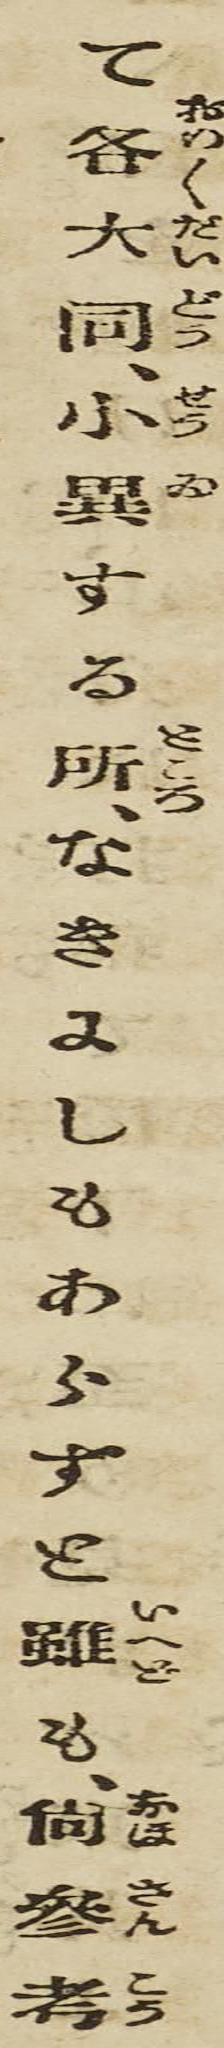て各大同、小異する所、なきにしもあらすと雖も、尚参考
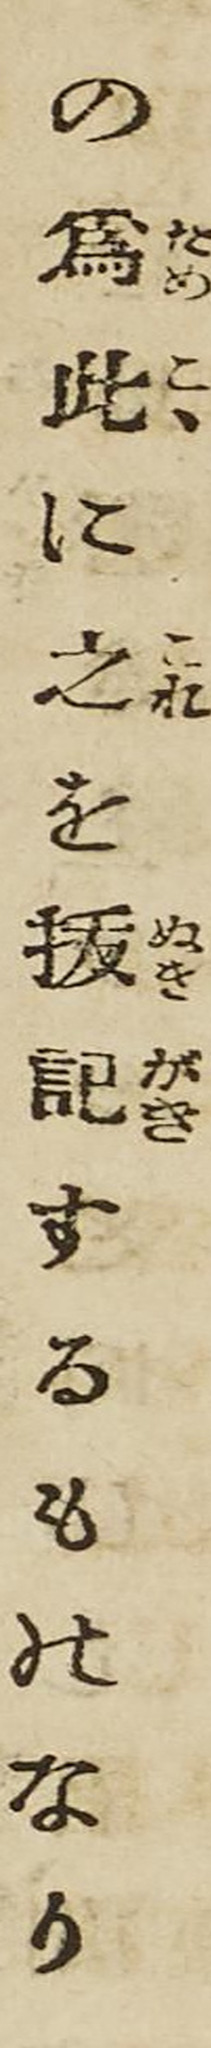の為此に之を抜記するものなり
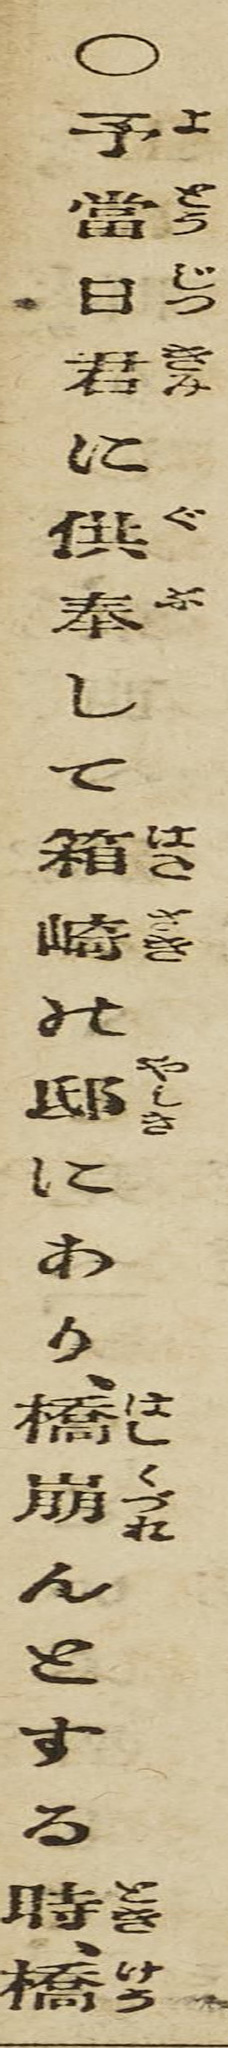○予当日君に供奉して箱崎の邸にあり、橋崩んとする時、橋

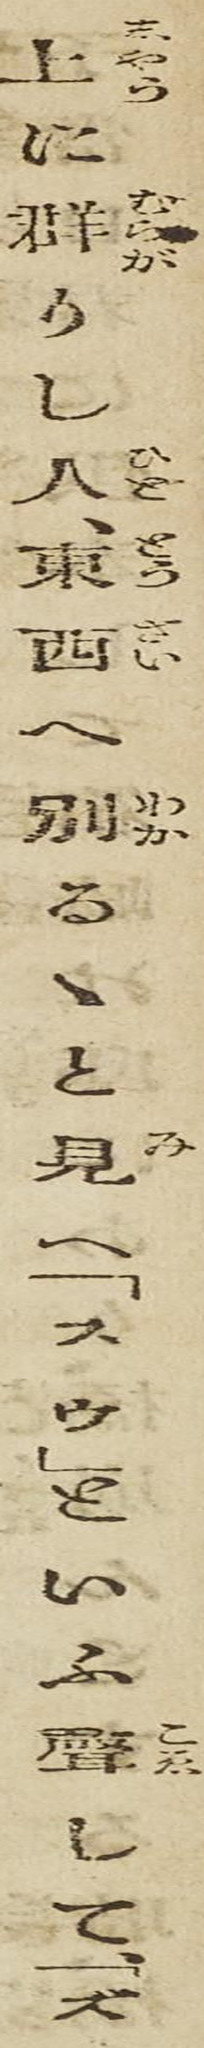上に群りし人、東西へ別るゝと見へ「スウ」といふ声して、「ズ
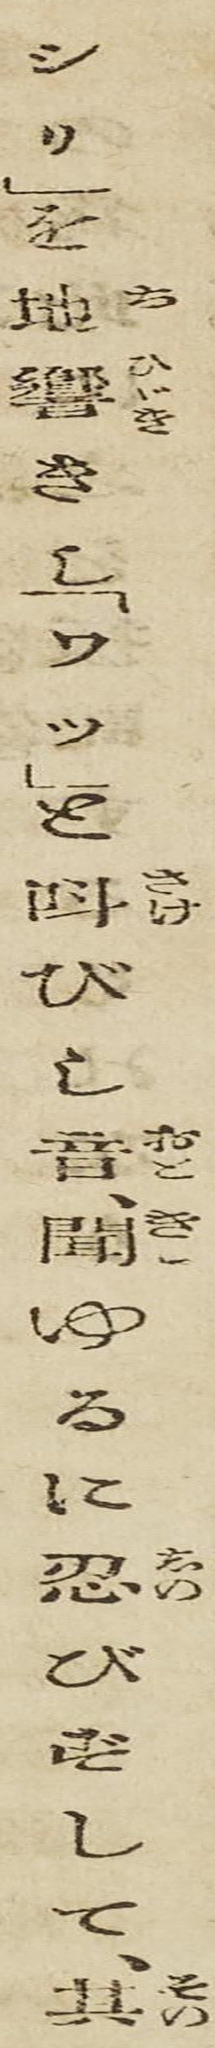シリ」を地響きし「ワツ」と叫びし音聞ゆるに忍びずして、其
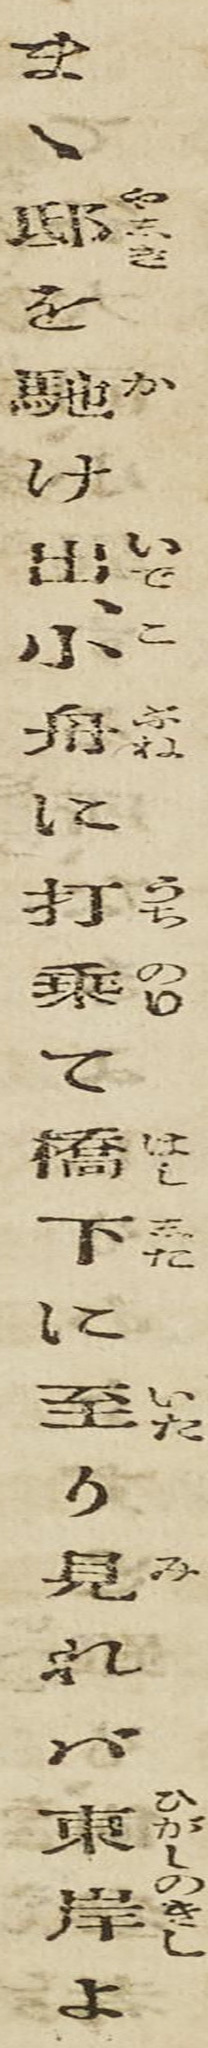まゝ邸を馳け出、小舟に打乗て橋下に至り見れば東岸よ
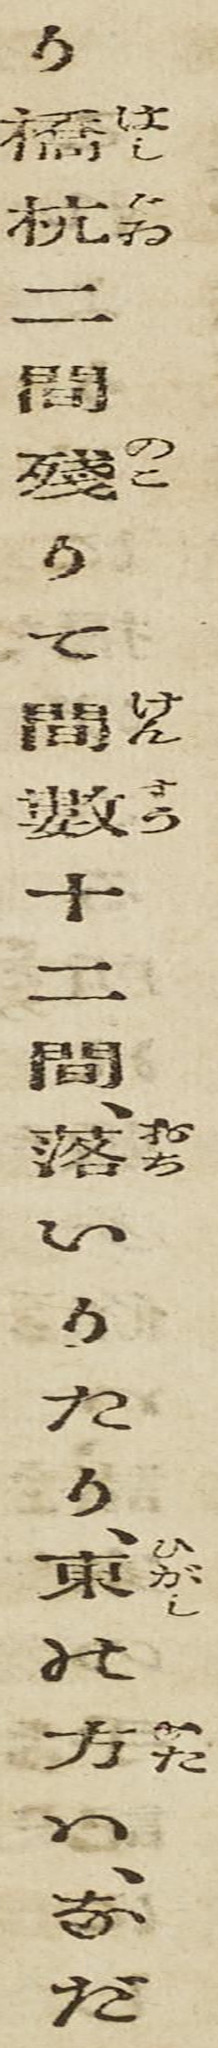り橋杭二間残りて間数十二間、落いりたり、東の方は、なだ
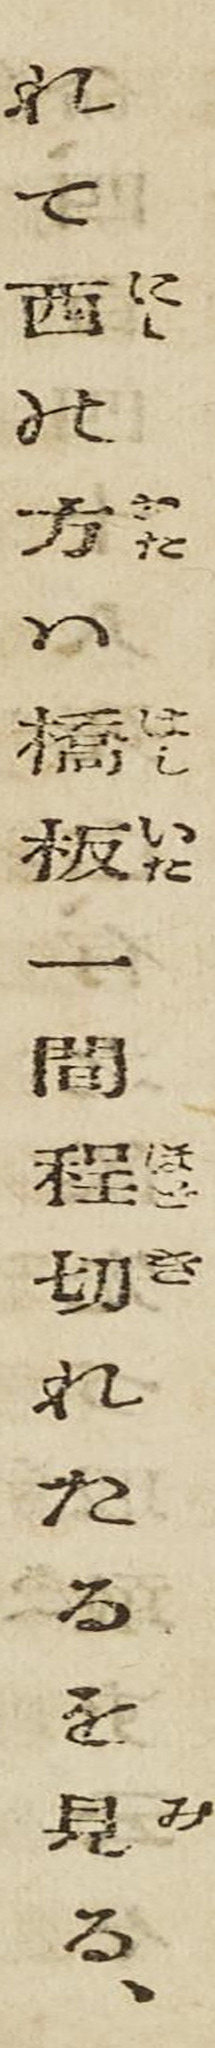れて西の方は橋板一間程切れたるを見る、
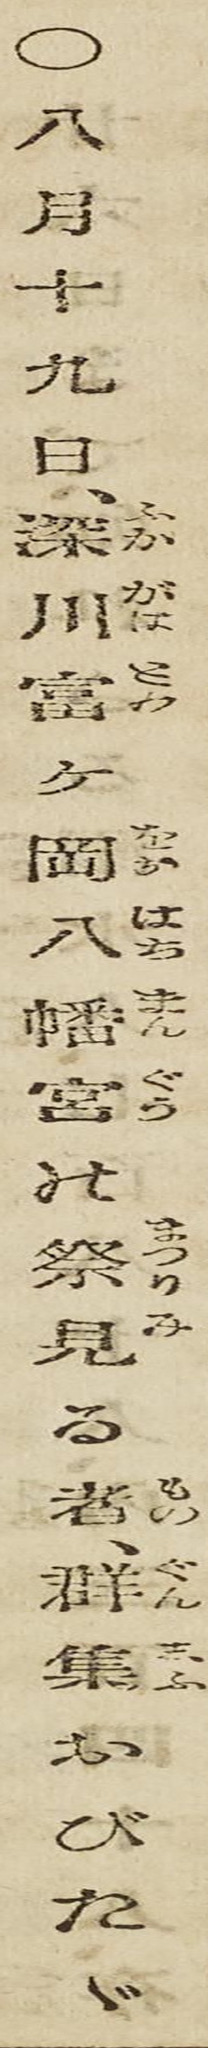○八月十九日、深川富ケ岡八幡宮の祭見る者、群集おびたゞ
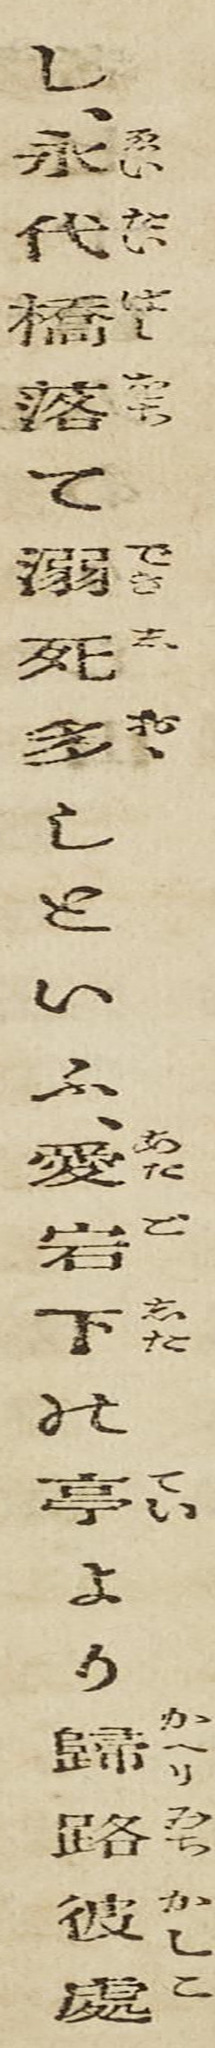し、永代橋落て溺死多しといふ、愛宕下の亭より帰路彼処
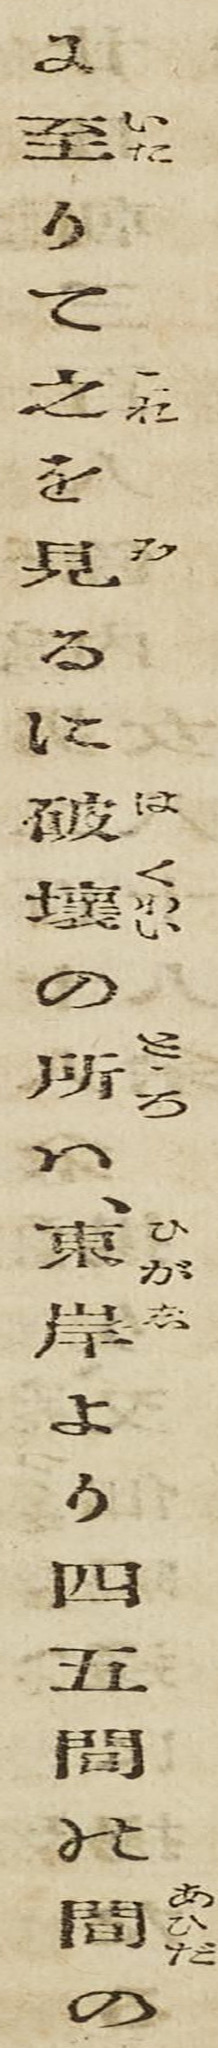に至りて之を見るに破壊の所は、東岸より四五間の間の
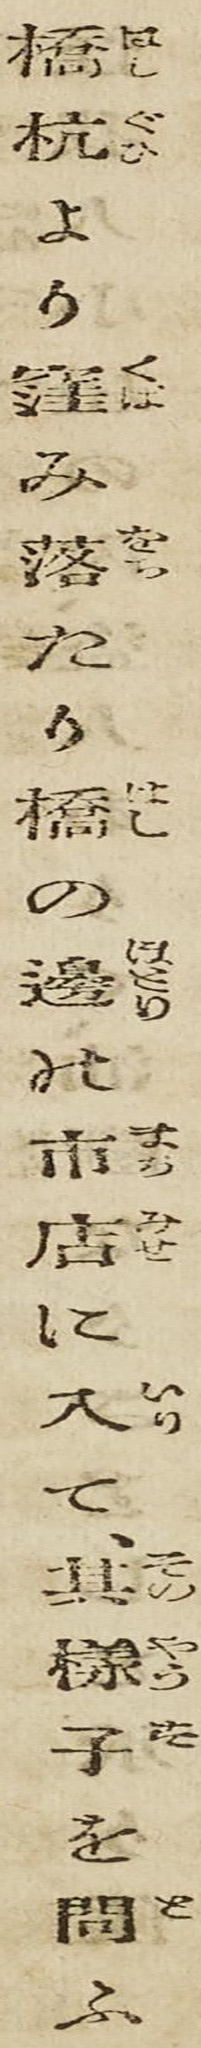橋杭より窪み落たり橋の辺の市店に入て、其様子を問ふ
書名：永代惨話　文化の夢　全
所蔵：東京大学地震研究所図書室 Earthquake Research Institute Library, The University of Tokyo, JAPAN
